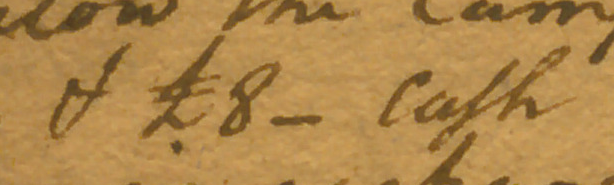& £8- cash
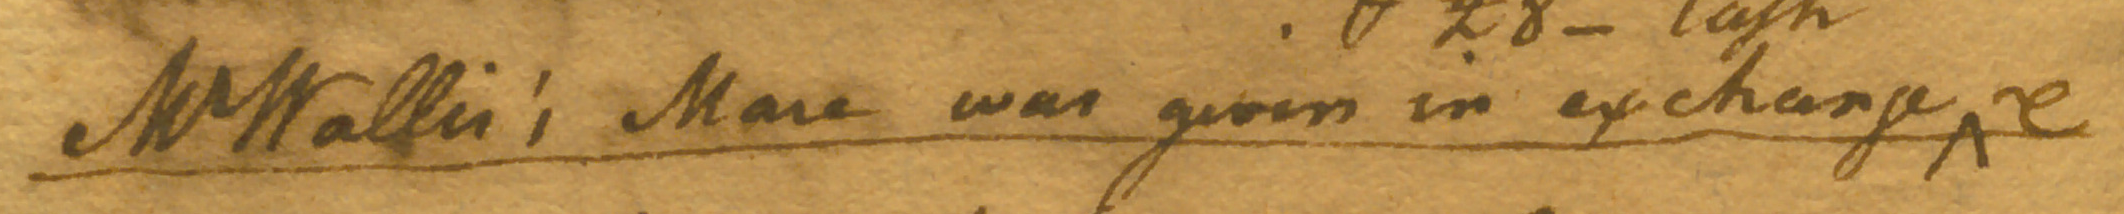M^r Wallis's Mare was given in exchange ^ &
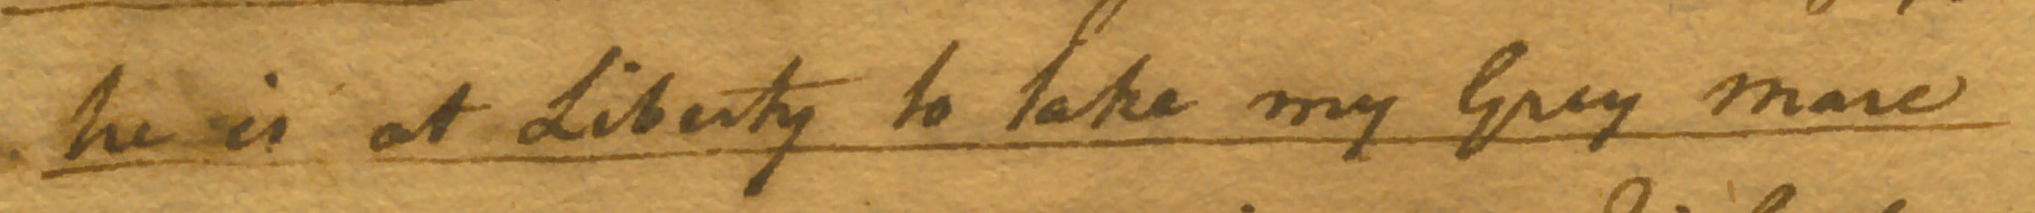he is at Liberty to take my Gray mare
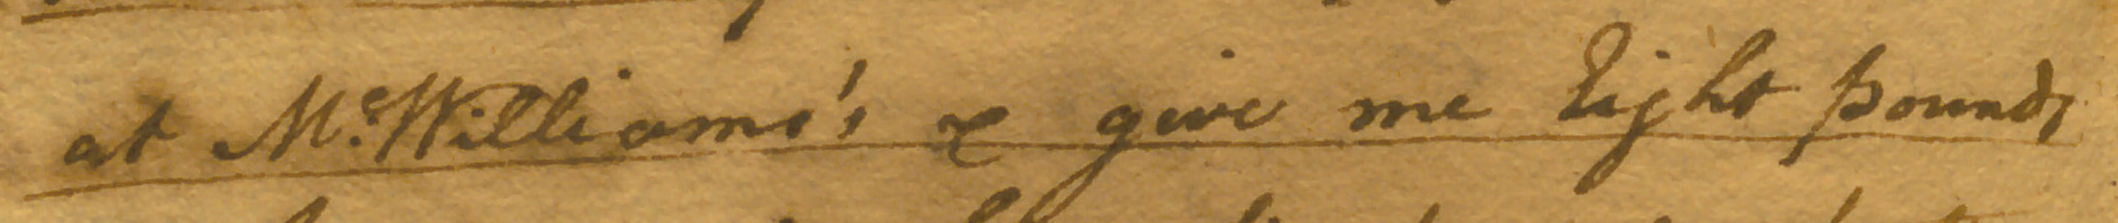at M^c:Williams's & give me Eight pounds
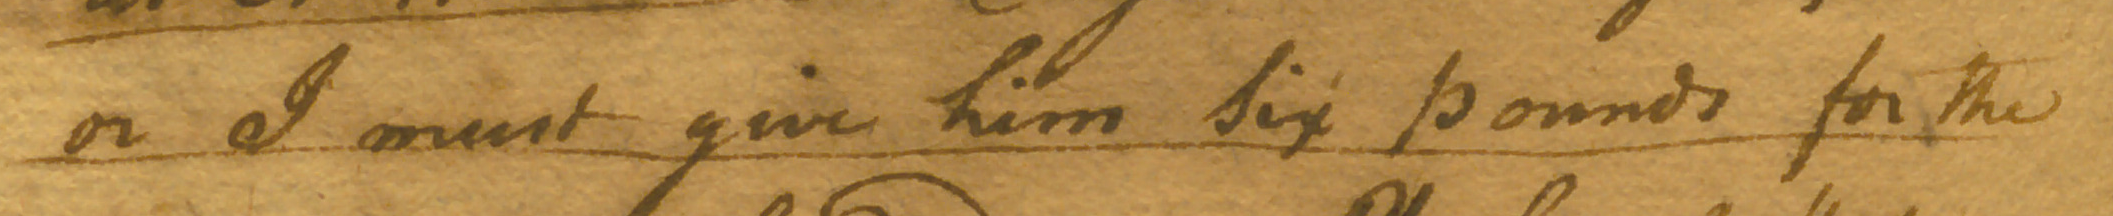or I must give him six pounds for the
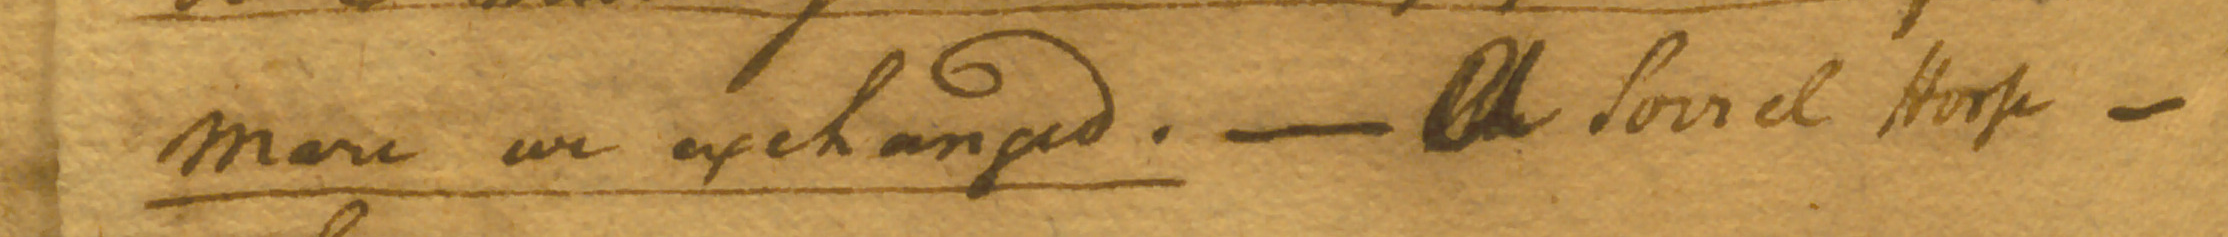mare we exchanged.- [__] Sorrel Horse-
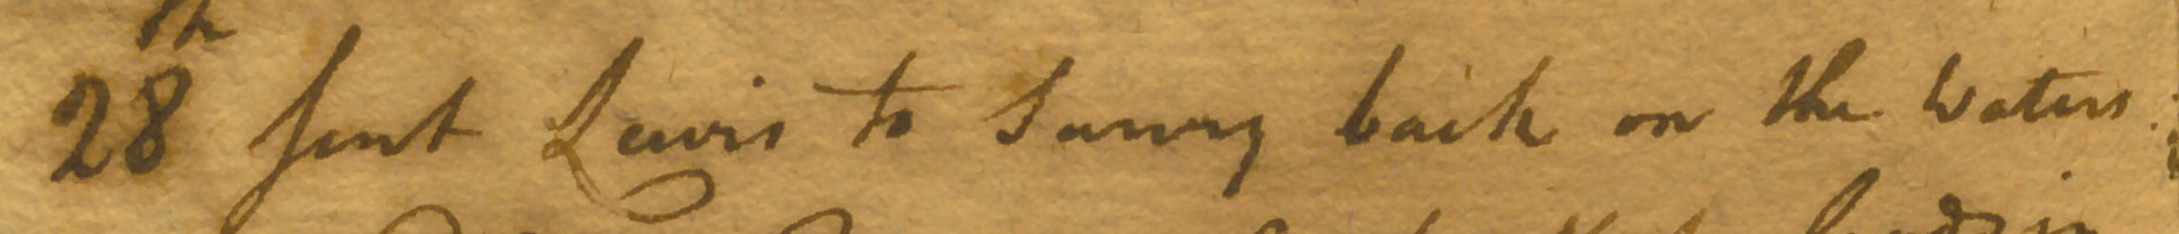28 Sent Lewis to survey back on the waters
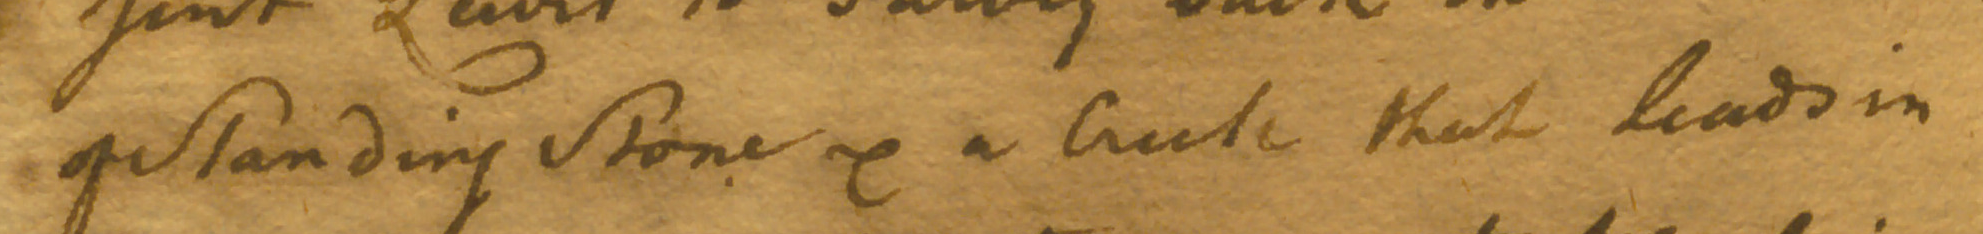of Standing Stone & a creek that leads in
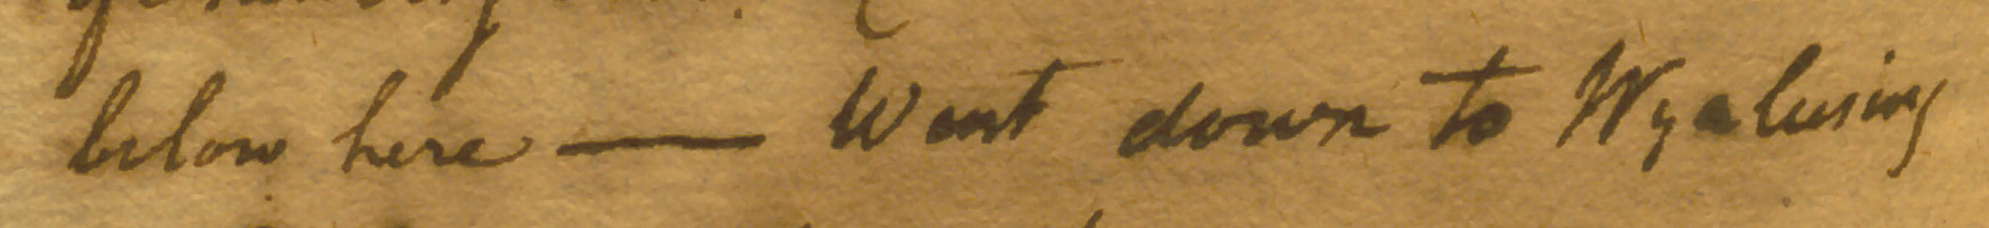below here- went down to Wyalusing
